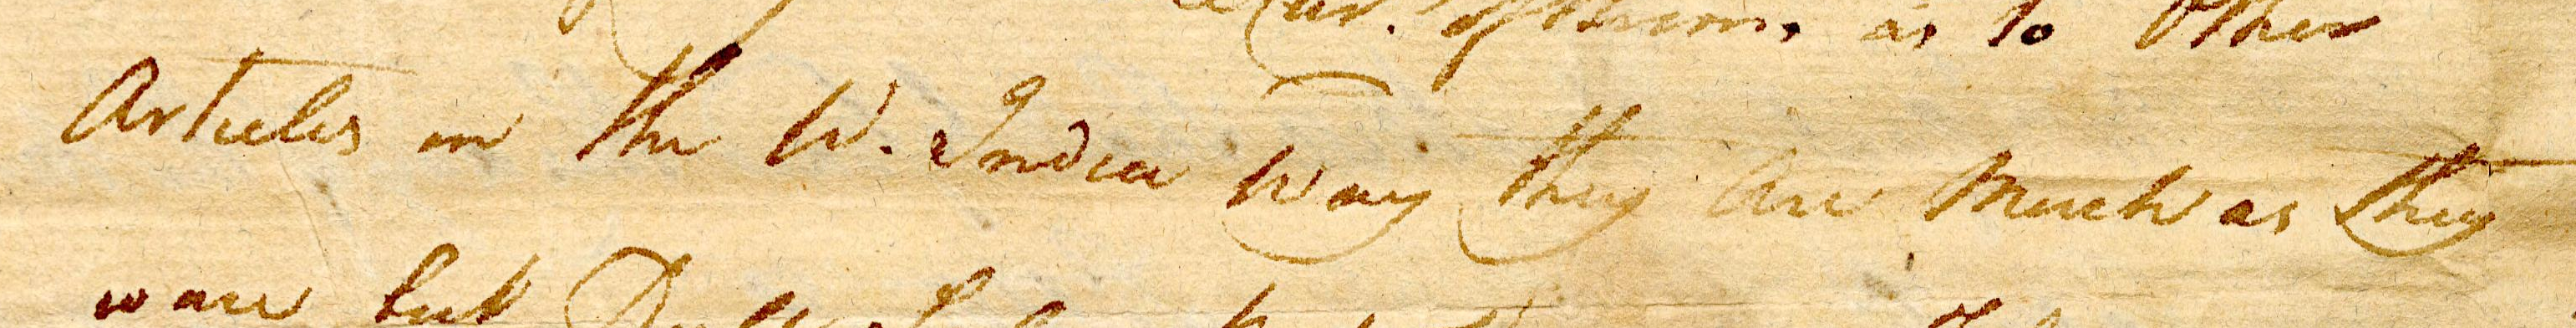Articles on the W. India Way they are much as they
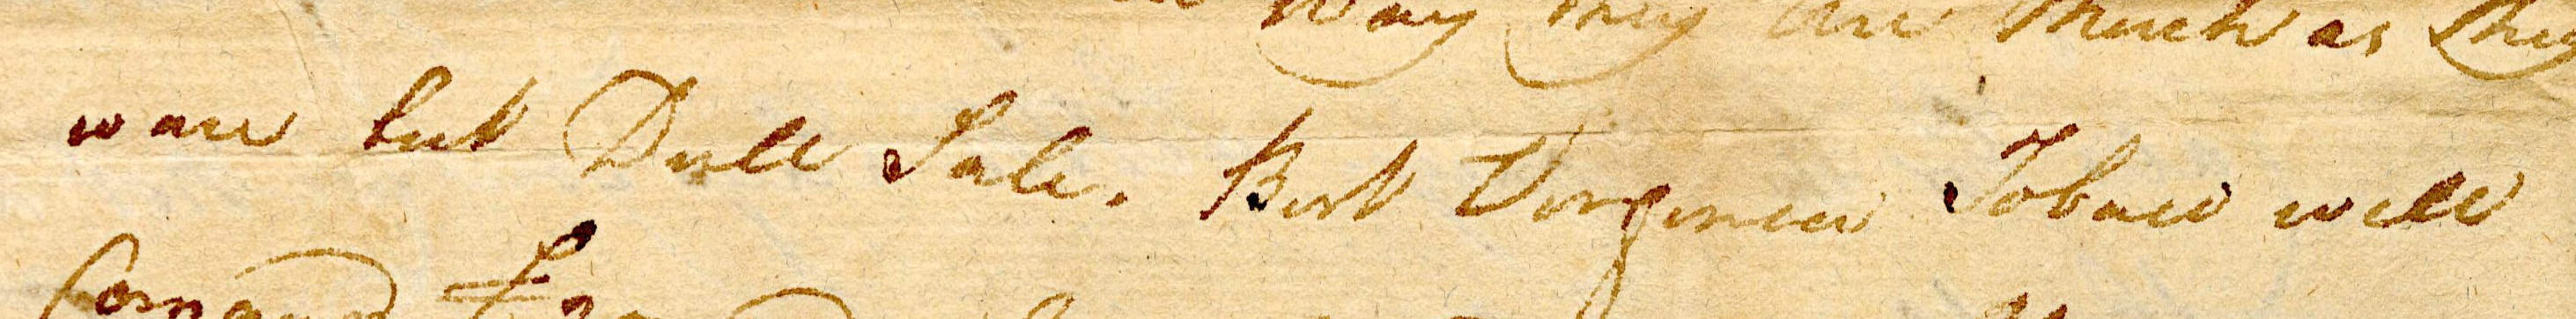were but Dull Sale. But Virginia Tobaco will
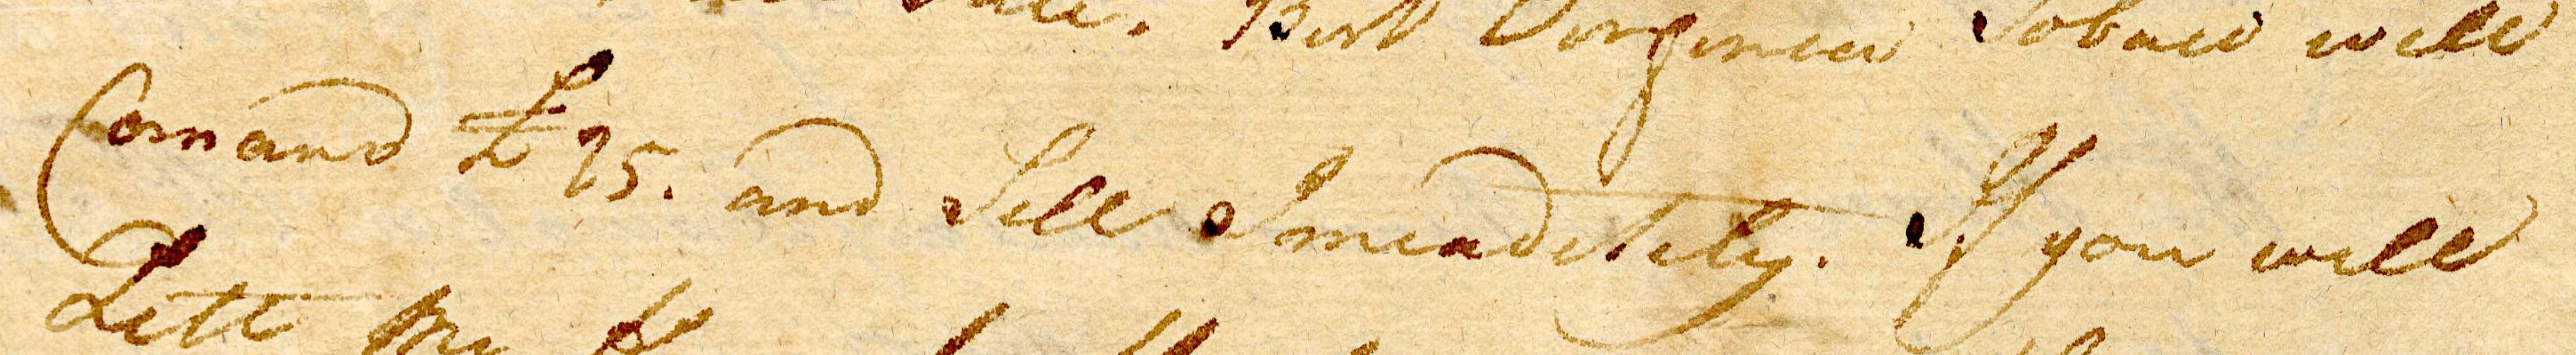Corn and £ 25. and Sell imeadetely, if you will
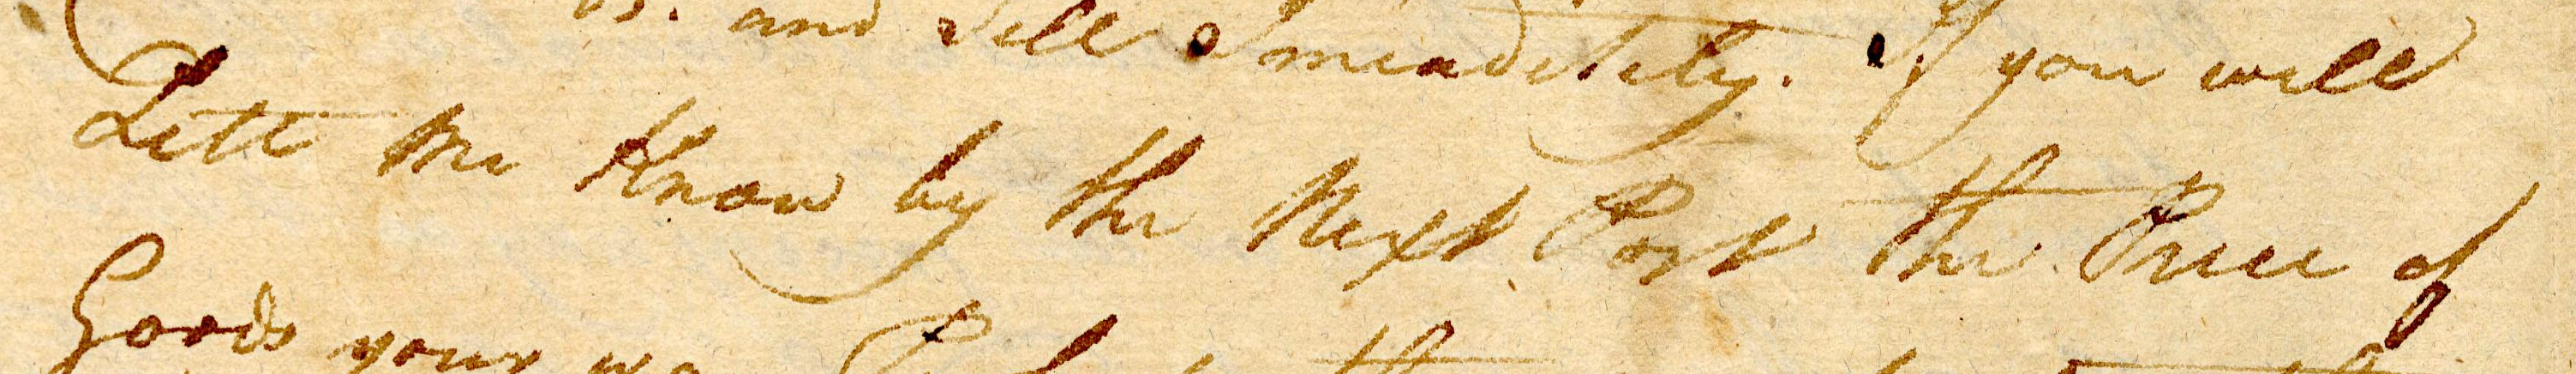Lett me know by the next Port the Price of
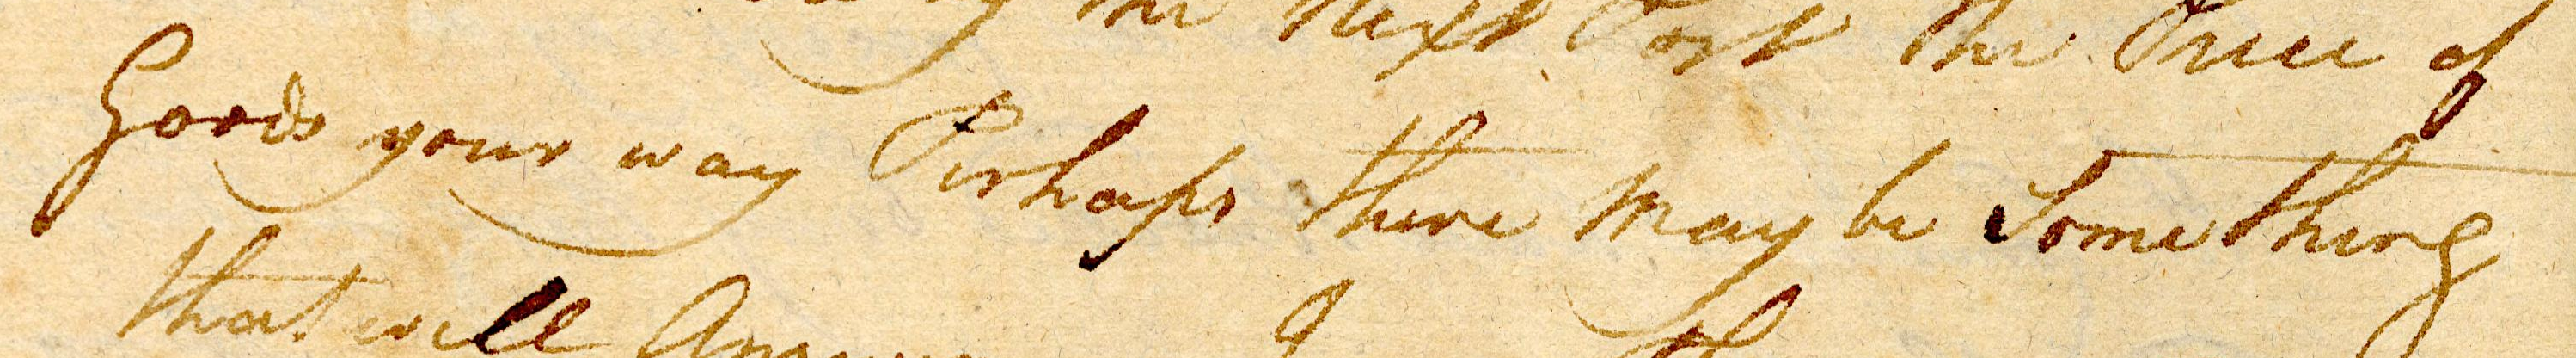Goods your way Perhaps there may be some thing
